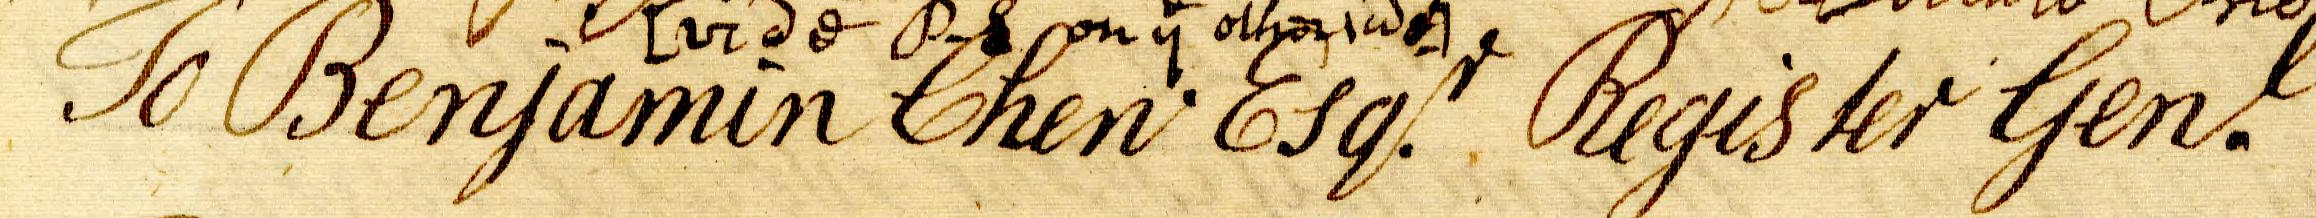To Benjamin Chew Esq^r. Register Gen^l.
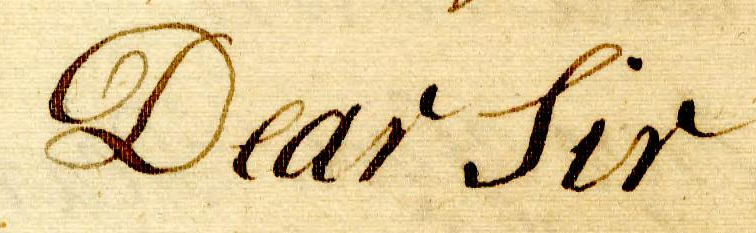Dear Sir
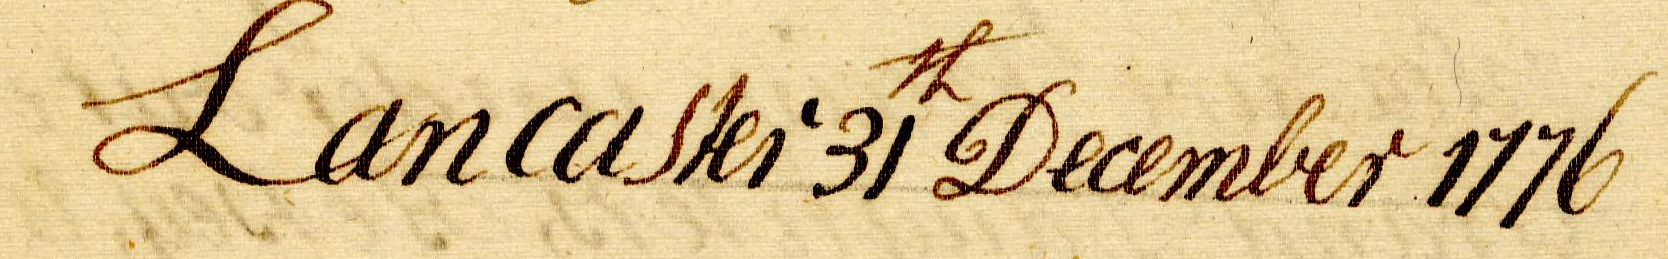Lancaster 31^th December 1776
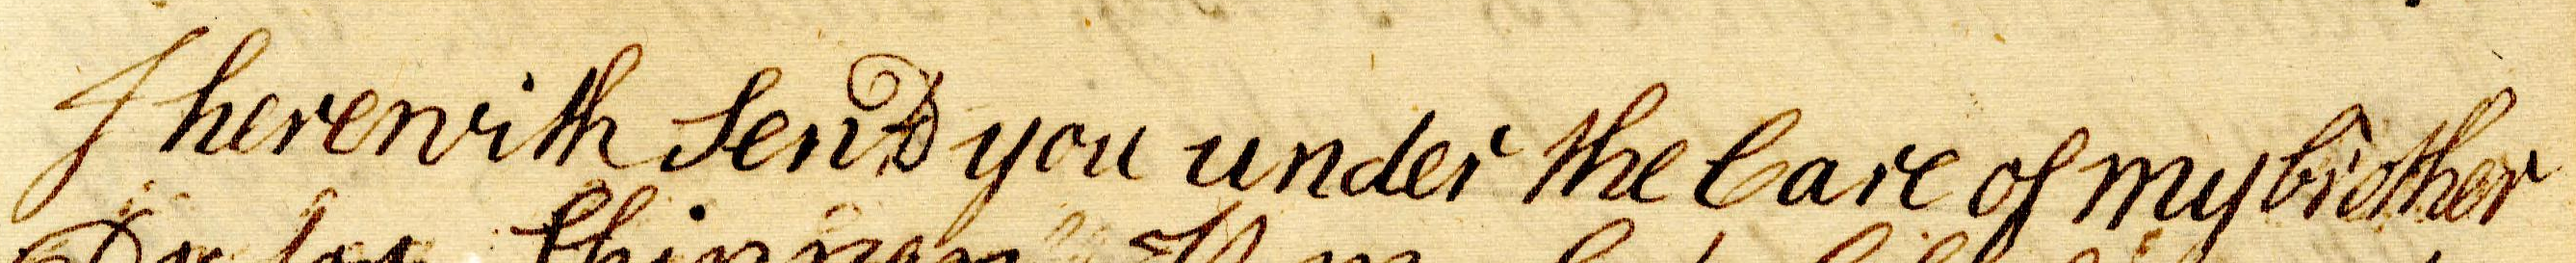I herewith Send you under the Care of My brother
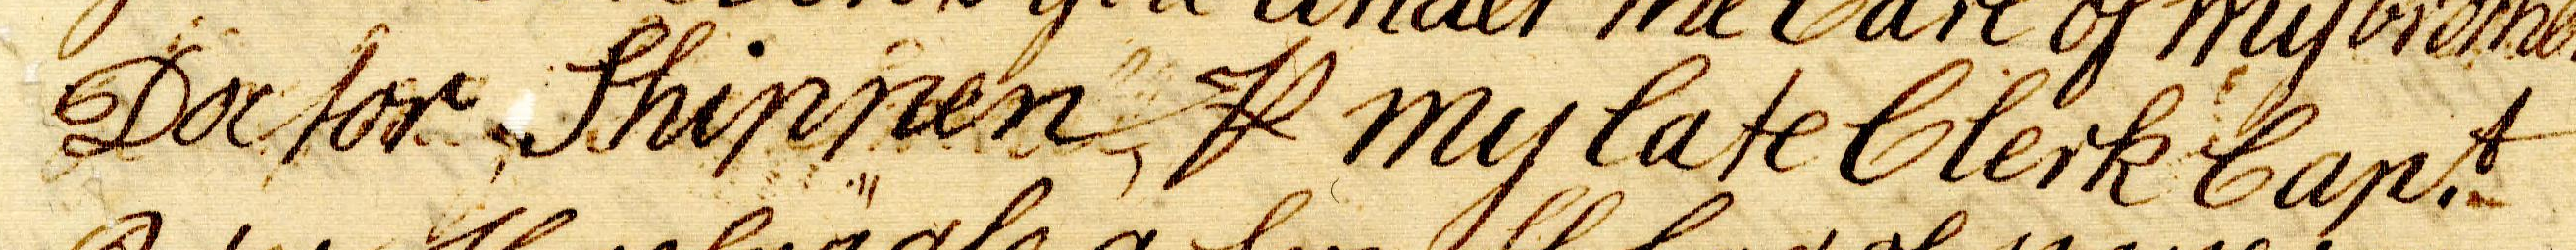Doc for Shippen, per My late Clerk Cap^t.
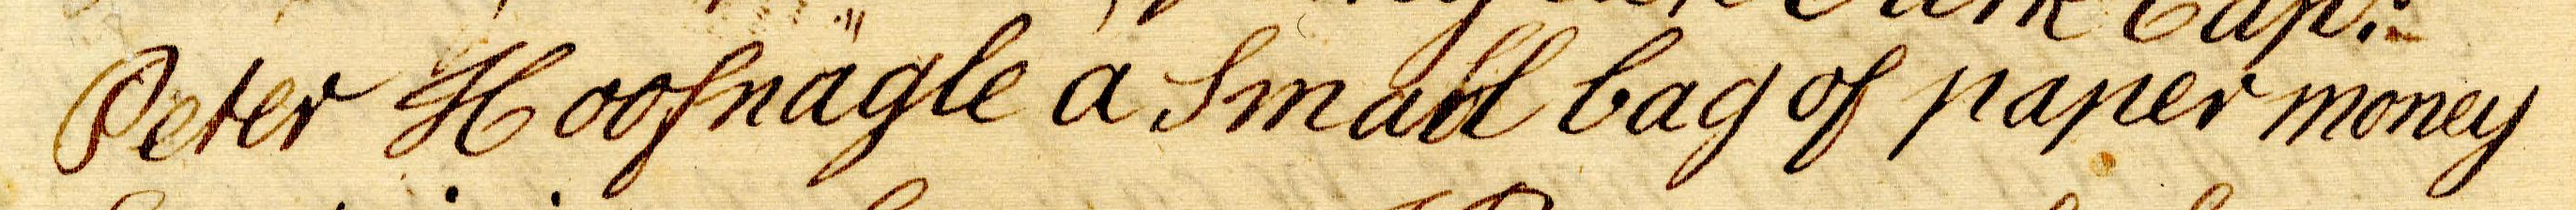Peter Hoofnagle a Small bag of paper money
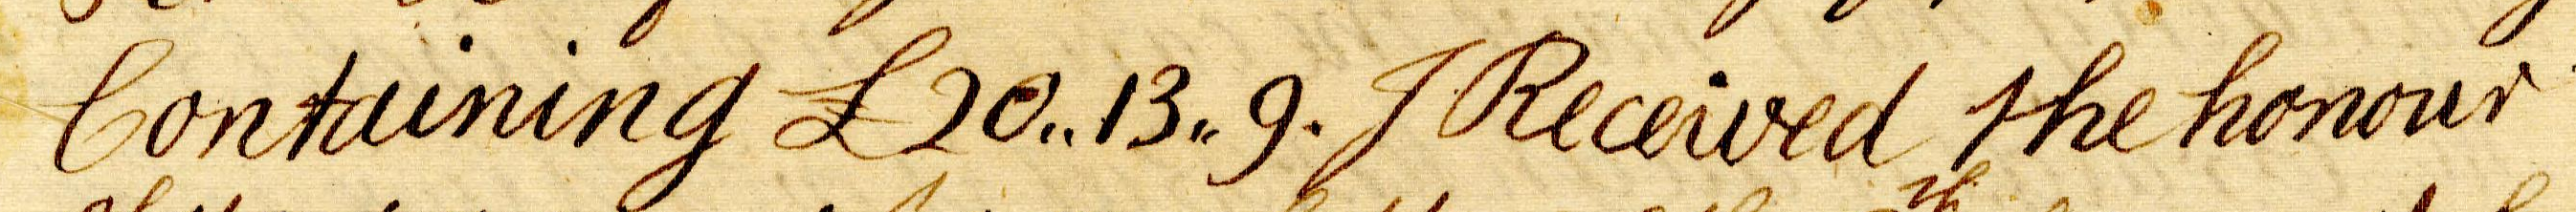Containing £20..13..9. I Received the honour
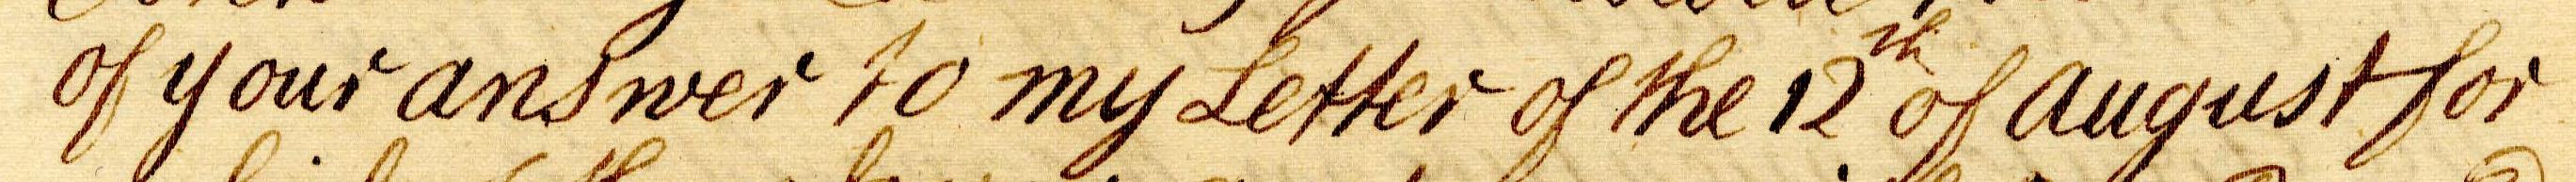of Your answer to my Letter of the 12^th of August for
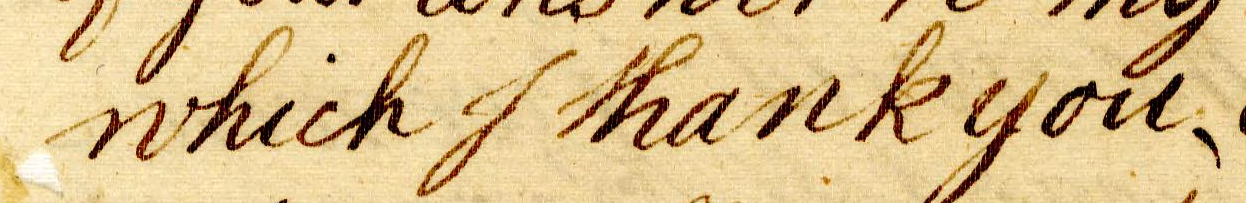which I thank you,
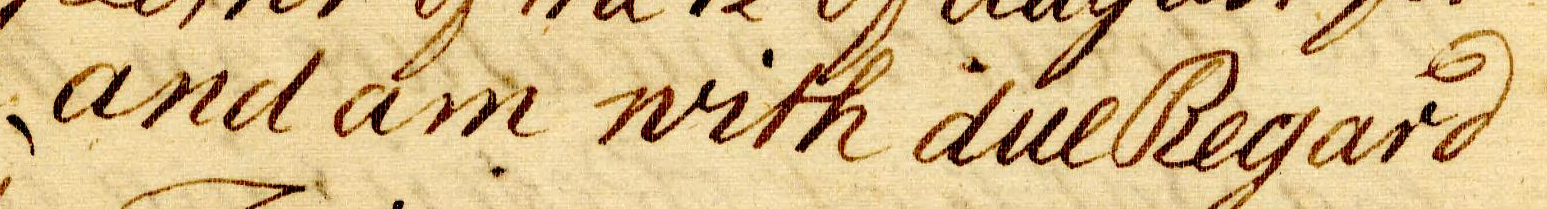and am with due Regard
